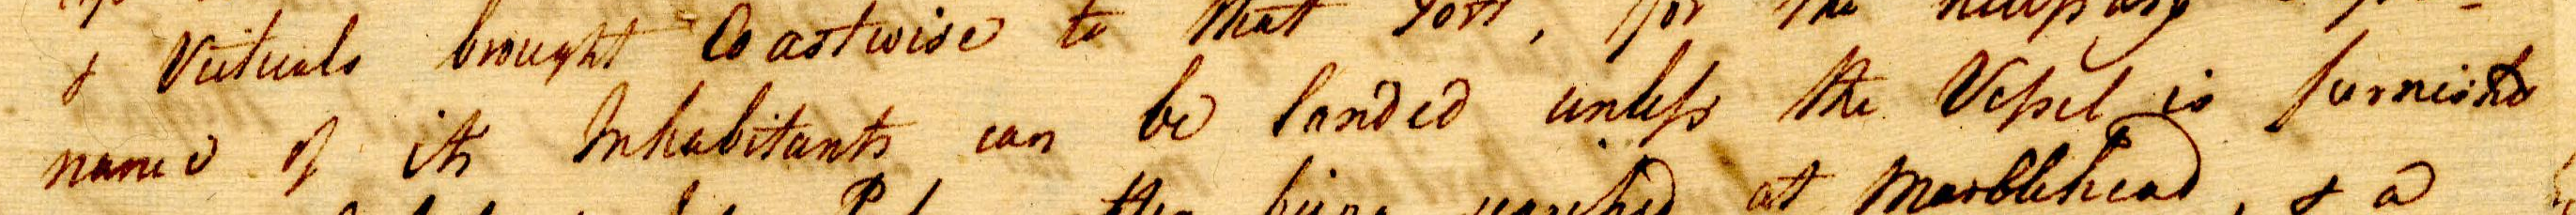nance of it Inhabitants can be landed unless the Vessel is furnish'd
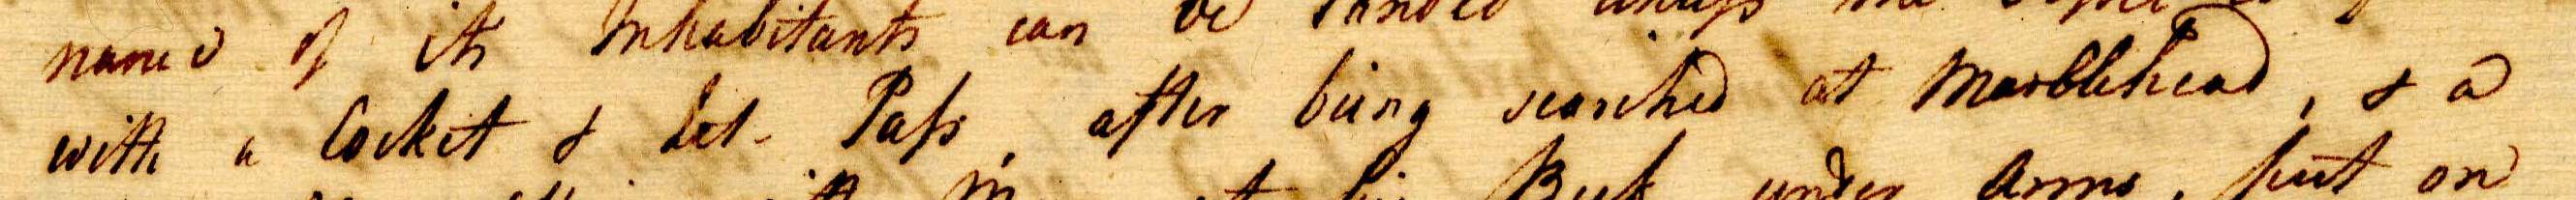with a Cocket & let Pass. after being searched at Marblehead, & a
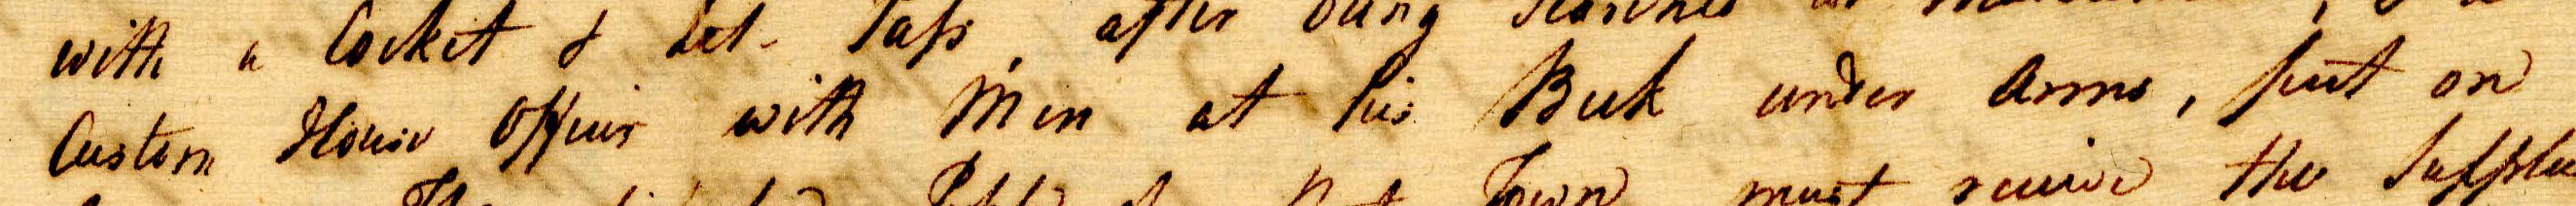Custom House Officer with Men at his Beck under Arms, put on
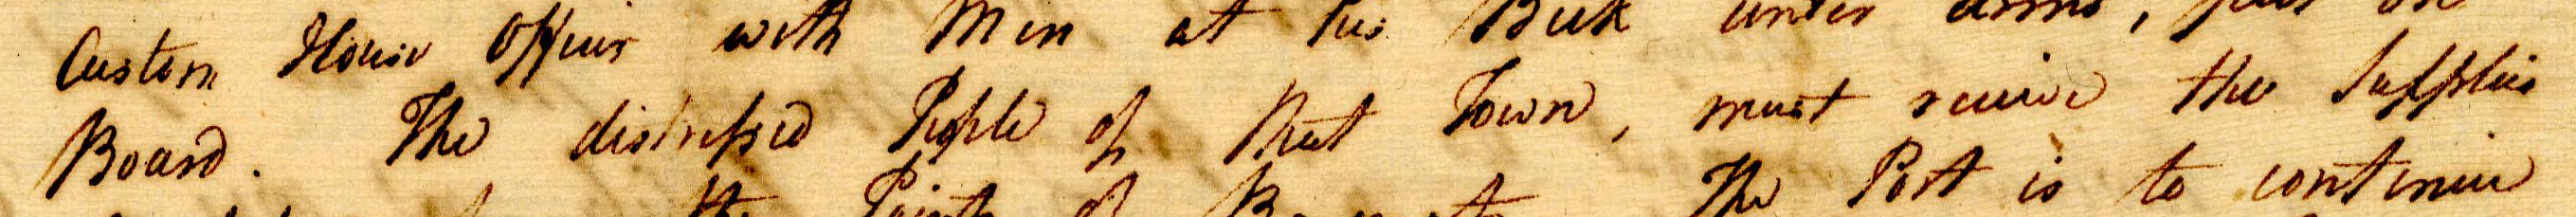Board. The distressed People of Moat Town must receive the Supplies
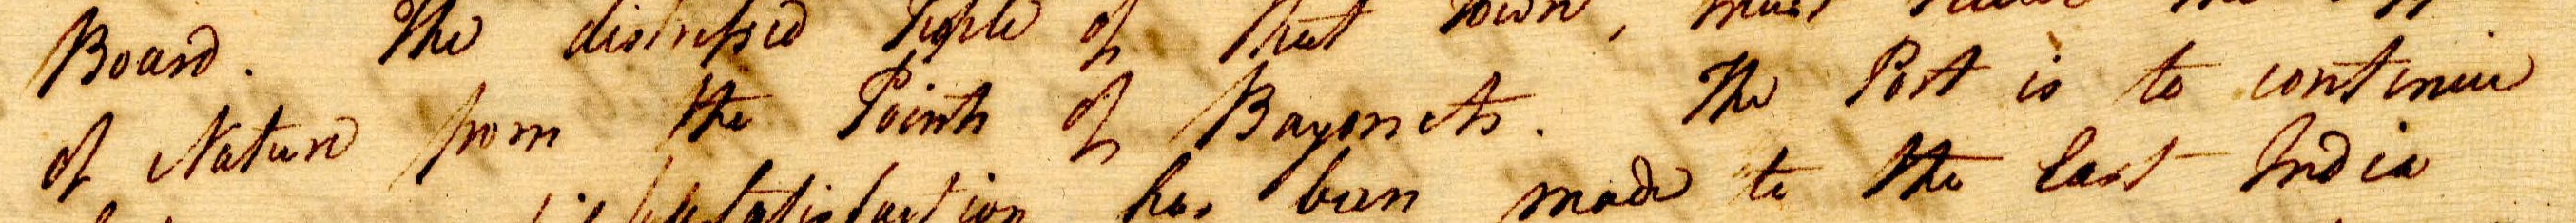of Nature from the Points of Bayonets. The Port is to continue
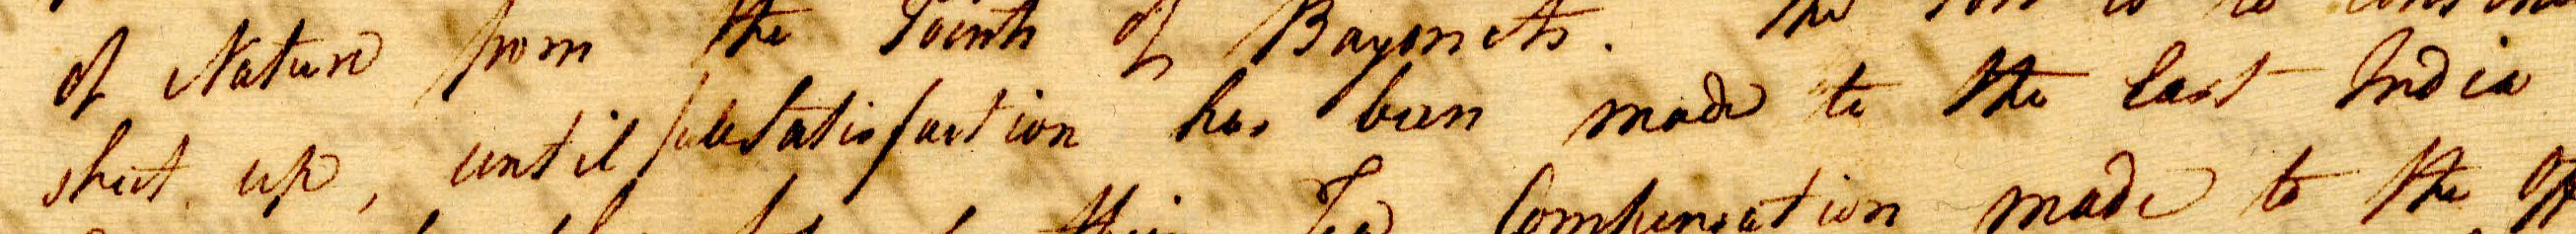shut up, until satisfaction has been made to the last India
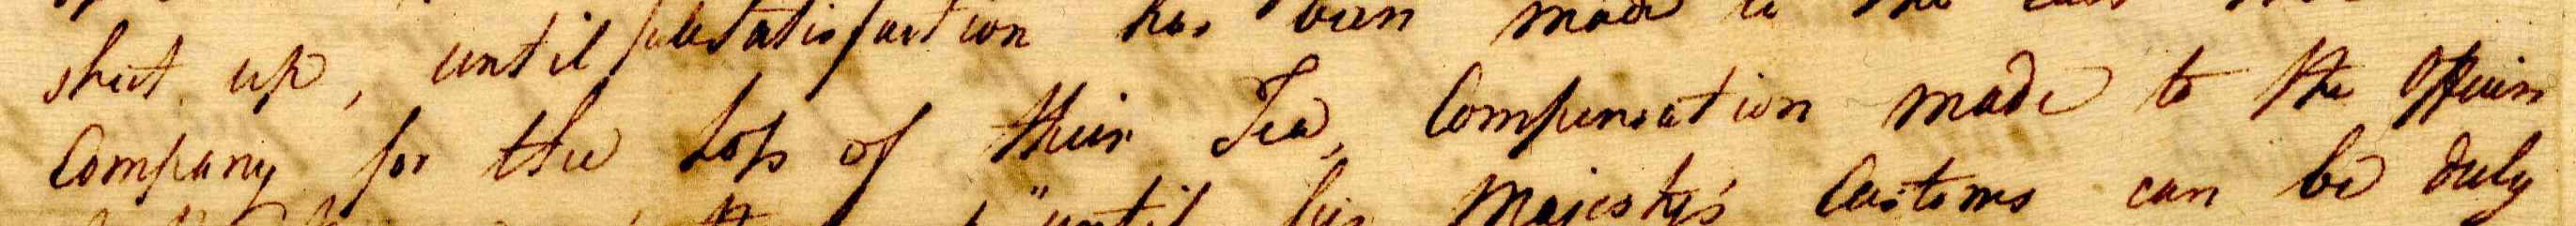Company for the Loss of their Sea, Compensation made to the Officers
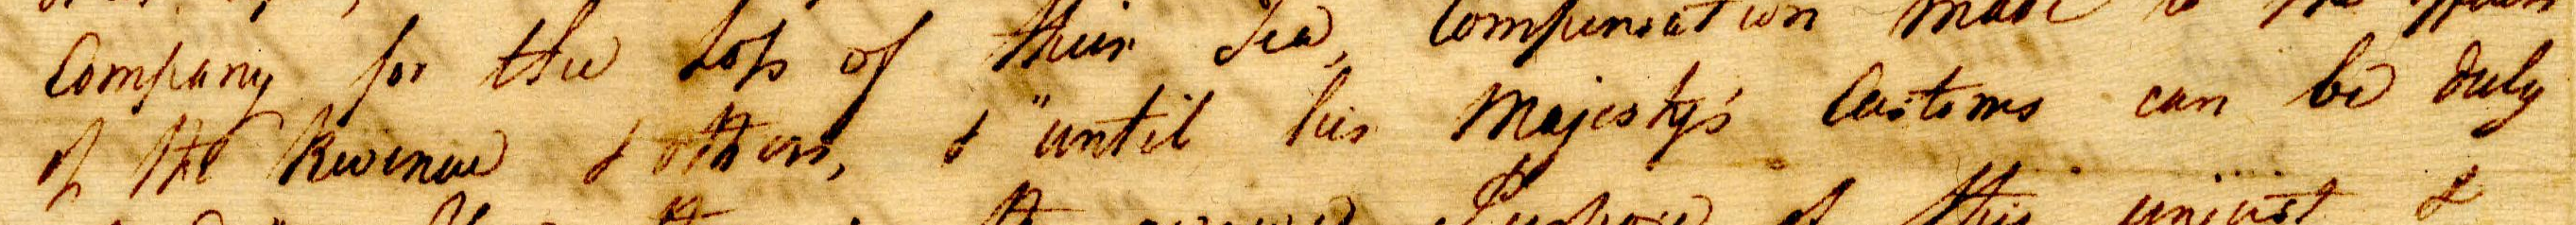of the Revenue & others, & until his Majesty's Customs can be duly
